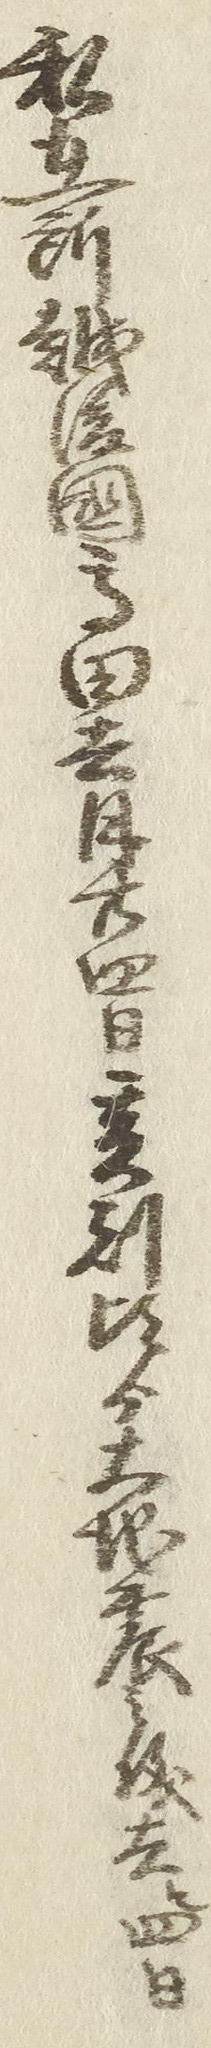私在所越後国高田去月廿四日亥刻頃ゟ大地震之儀去ル四日
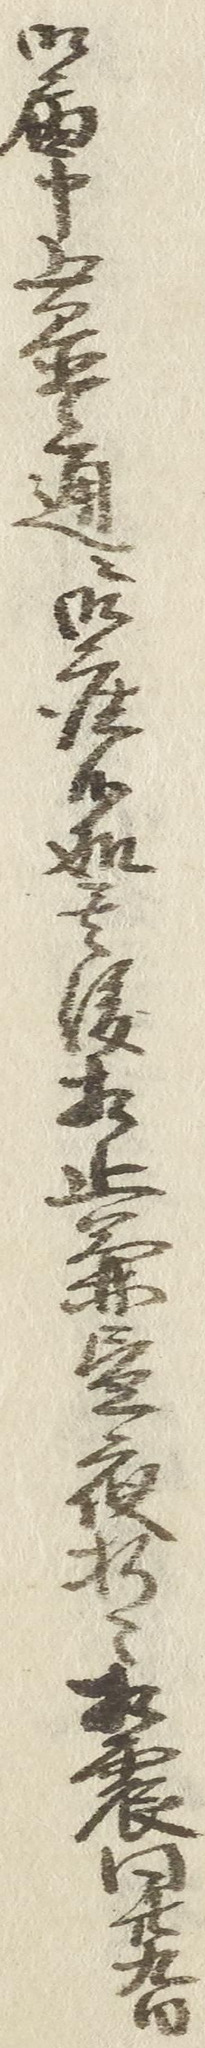御届申上置候通ニ御座候処其後相止兼昼夜折々相震同廿九日
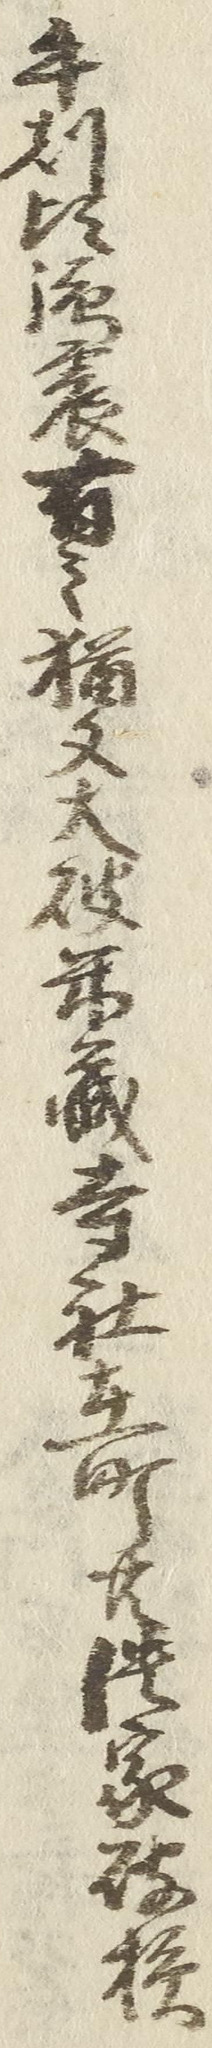午刻頃強震有之猶又大破米蔵寺社在町共潰家破損
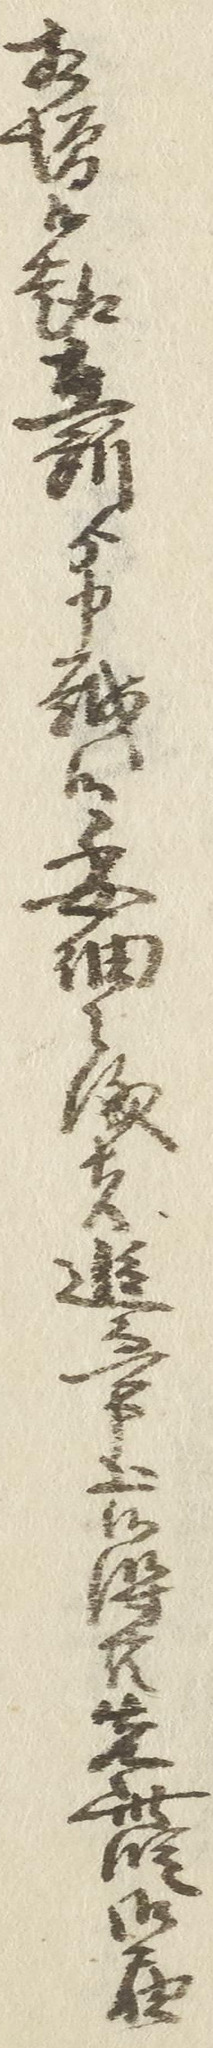相増候趣在所ゟ申越候委細之儀は追而可申上候得共先此段御届
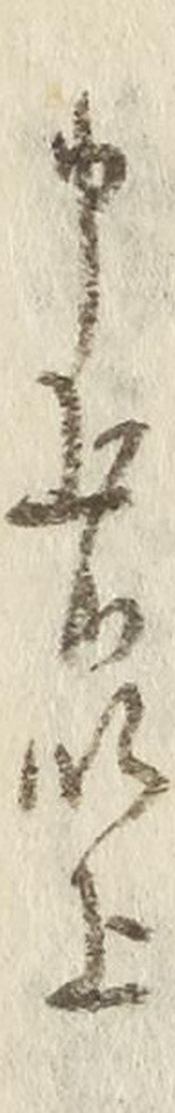申上候以上
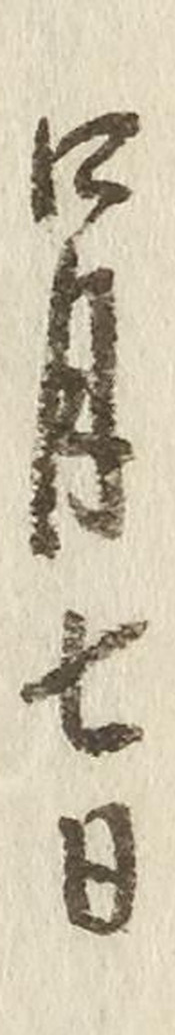四月七日

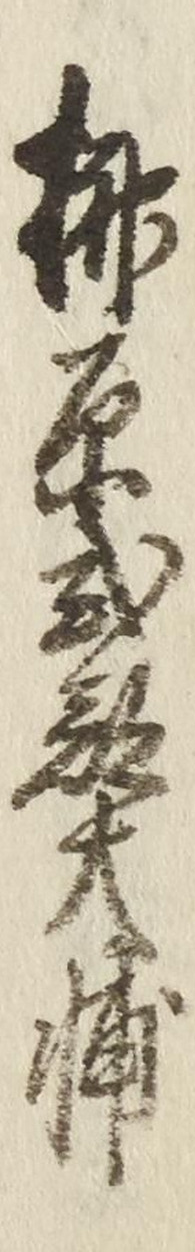榊原式部大輔
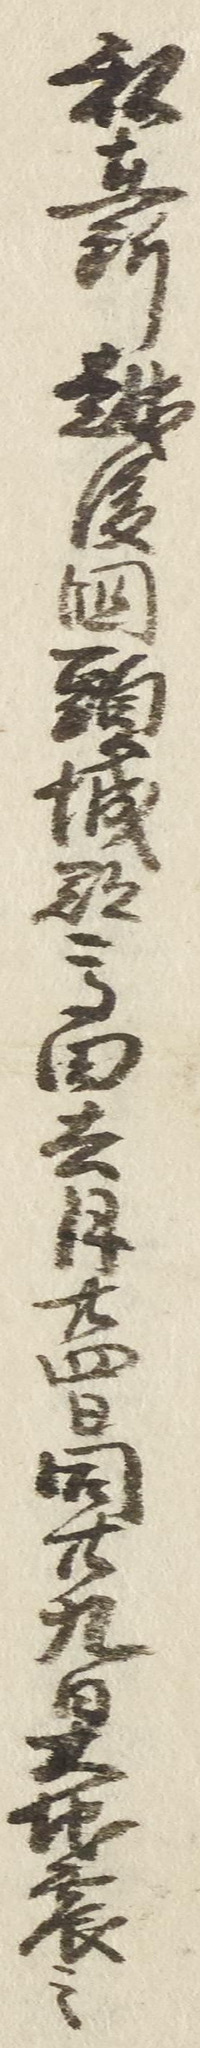私在所越後国頸城郡高田去月廿四日同廿九日大地震之
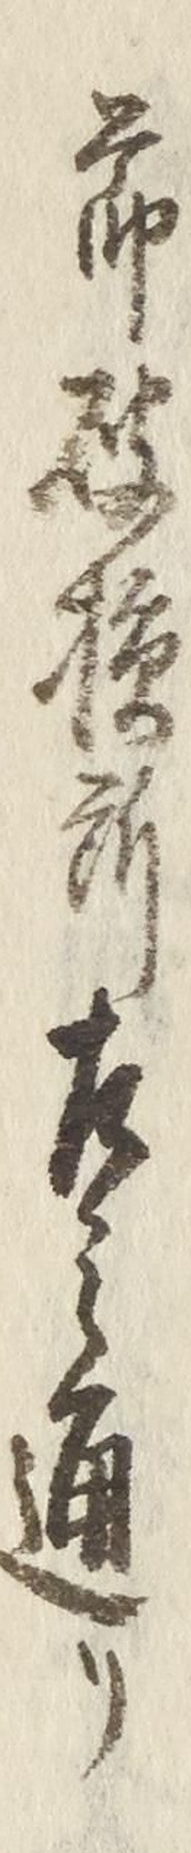節破損所左之通
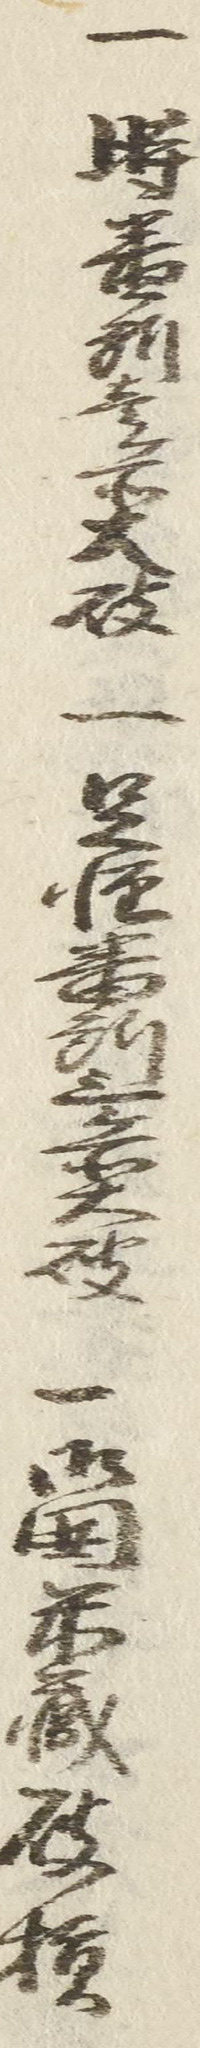一時番所壱ヶ所大破一足軽番所三ヶ所大破一御囲米蔵破損
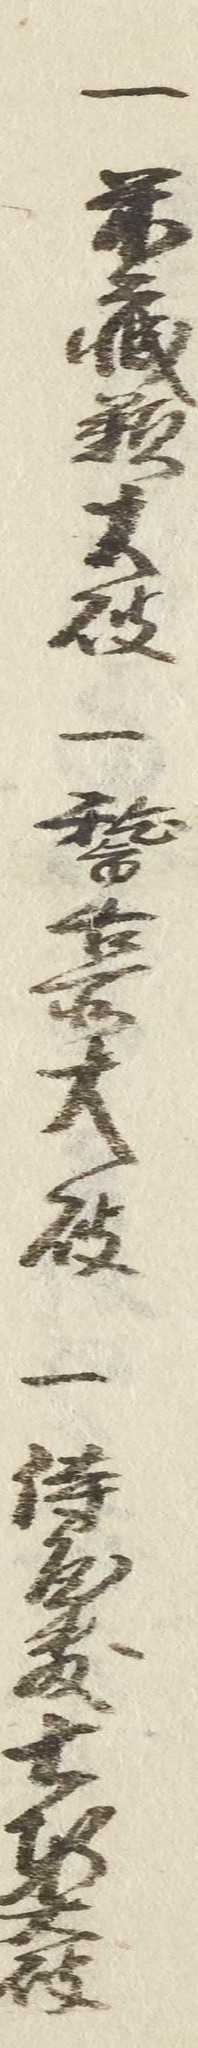一米蔵類大破一稽古所大破一侍屋敷七軒大破
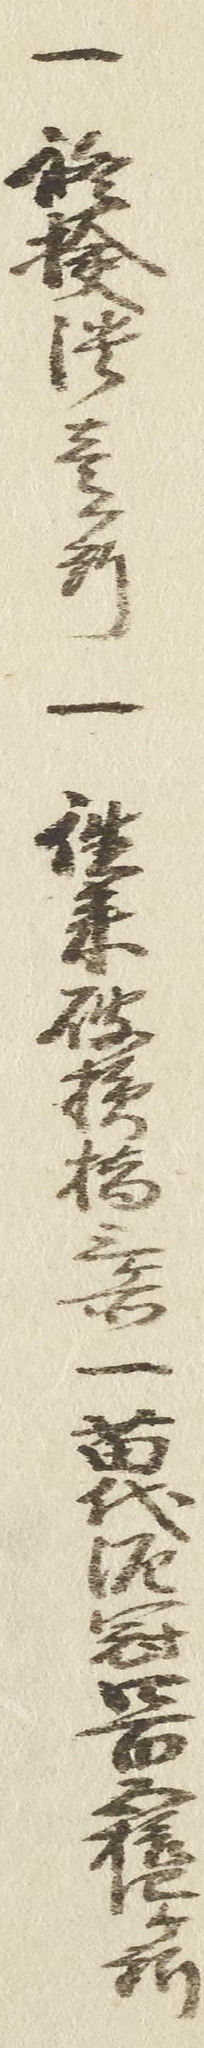一修検潰壱ヶ所一往来破損橋三ヶ所一苗代泥冠四百五拾四ヶ所
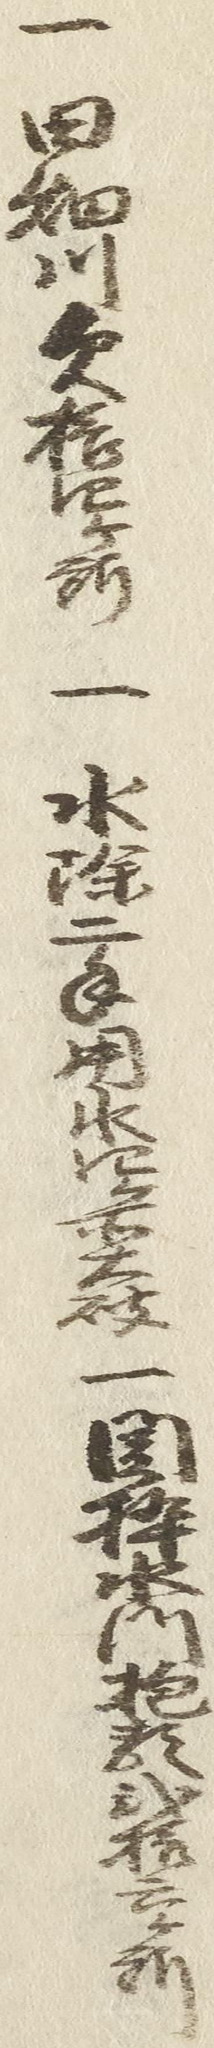一田畑川欠拾四ヶ所一水除土手用水四ヶ所大破一関枠水門抱類弐拾六ヶ所
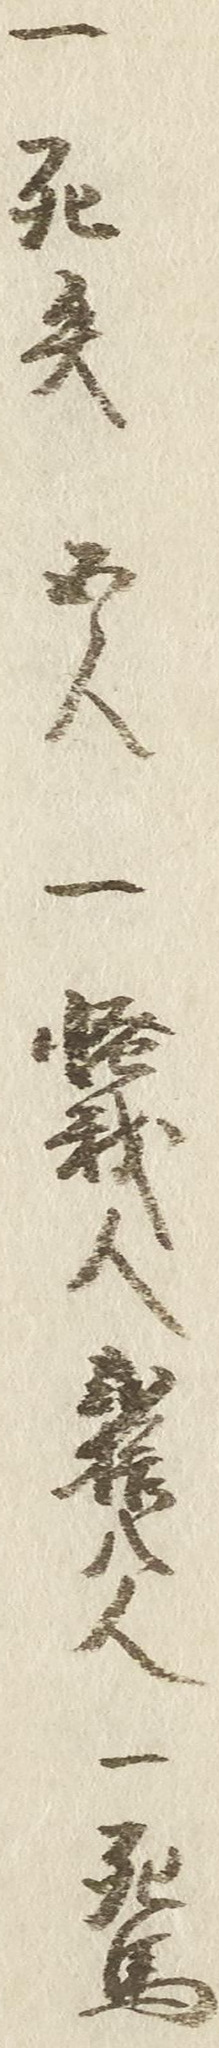一死失五人一怪我人弐拾八人一死馬弐疋
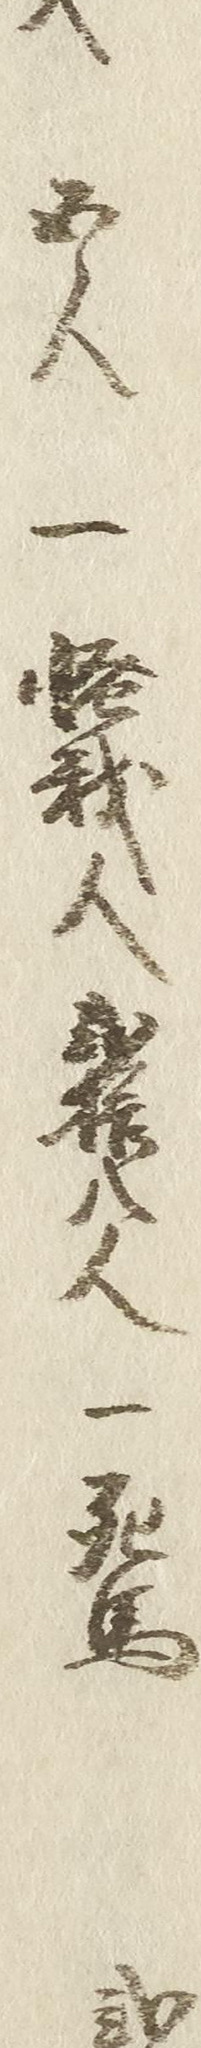一死失五人一怪我人弐拾八人一死馬弐疋
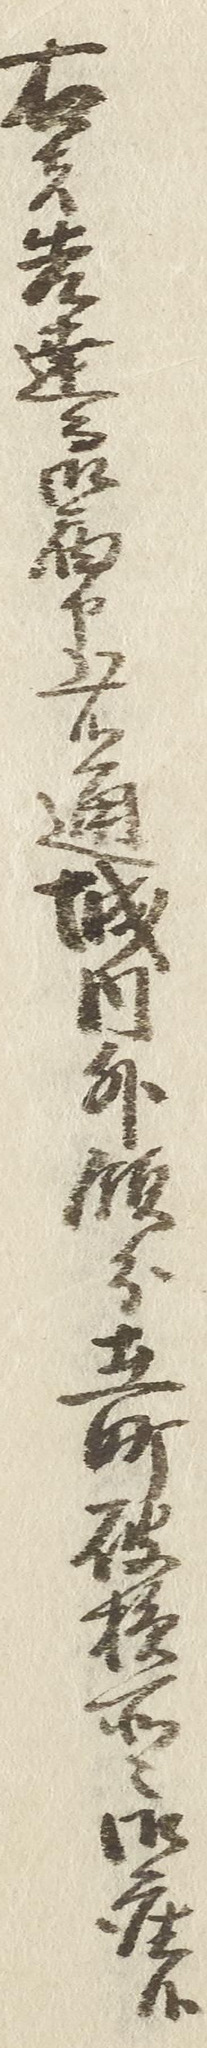右は先達而御届申上候通城内外領分在町破損所二御座候
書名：従往古地震御届書記誌之一
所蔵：東京大学地震研究所図書室 Earthquake Research Institute Library, The University of Tokyo, JAPAN
